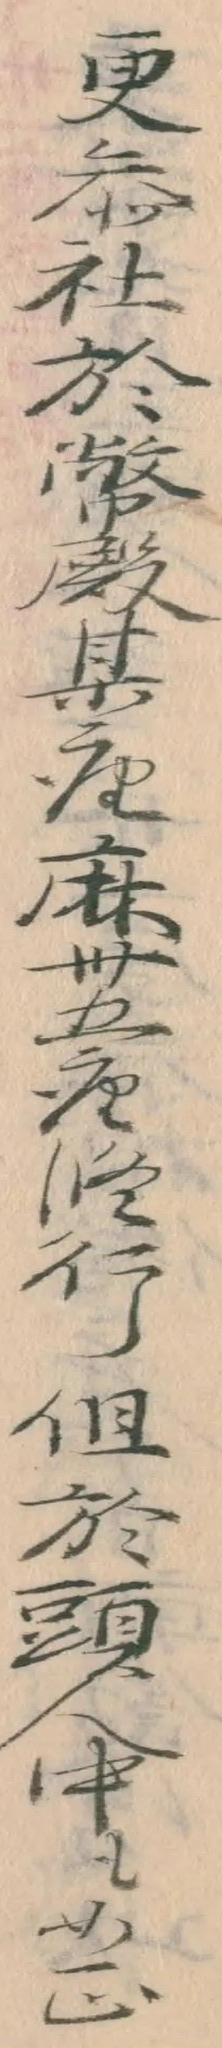更参社於幣殿某座麻卅五座修行但於頭人中も如正
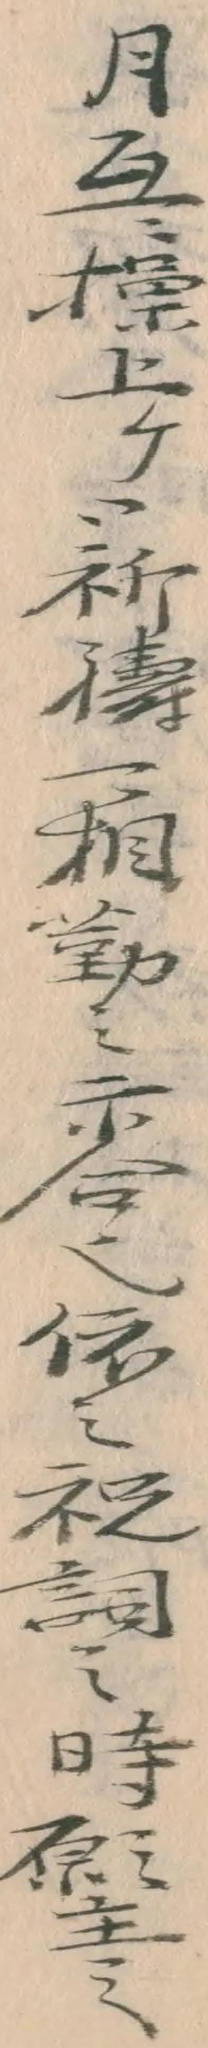月互ニ操上ケ御祈祷可相勤之示合也依之祝詞之時願主之
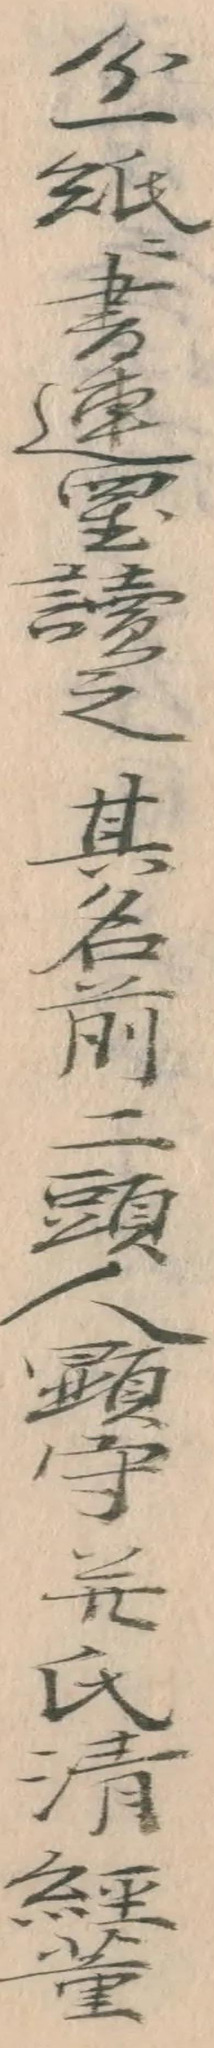分一紙ニ書連置讀之其名前二頭人顕守并氏清経董
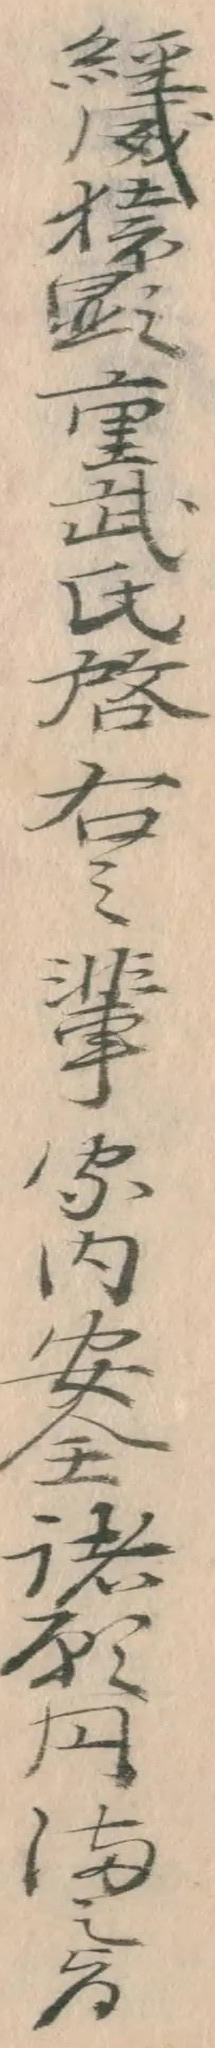経威猿顕重武氏啓右之輩家内安全諸願丹満之旨
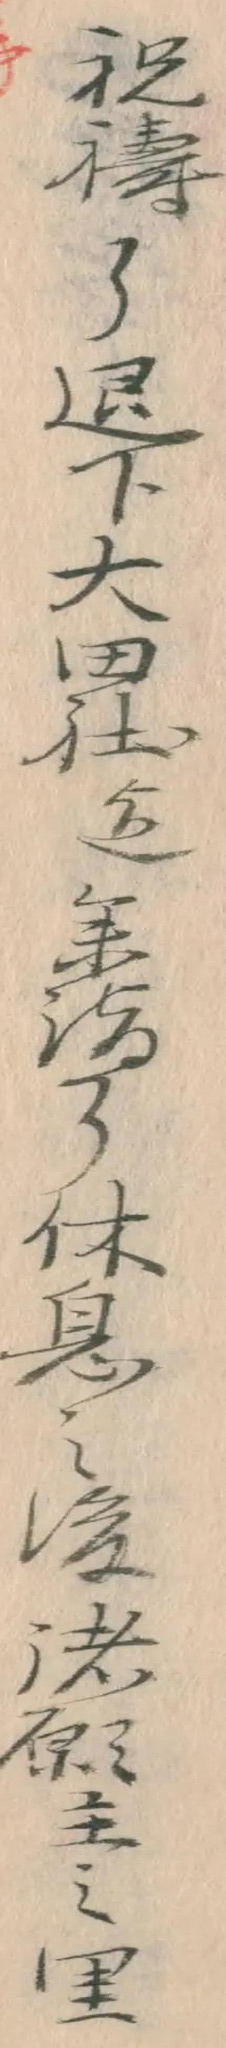祝祷了退下大田社迄参詣了休息之後諸願主之里
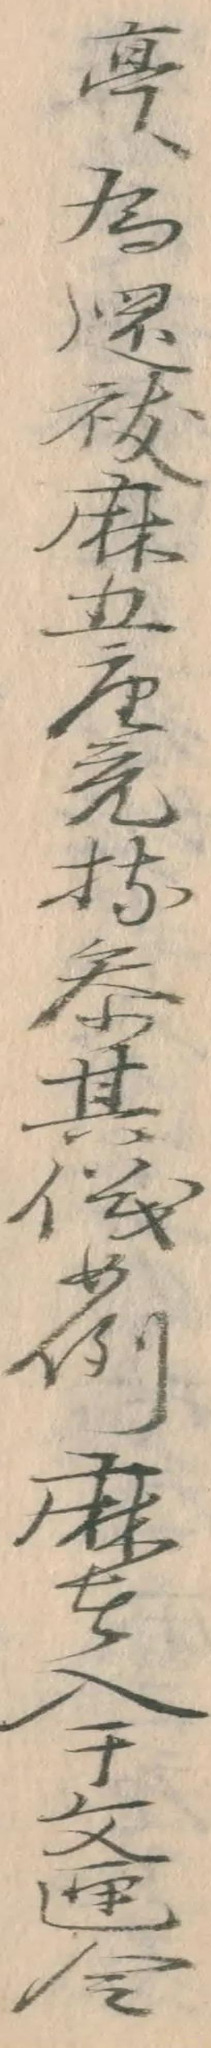亭へ為還被麻五座充持参其儀如例麻は入于文匣令
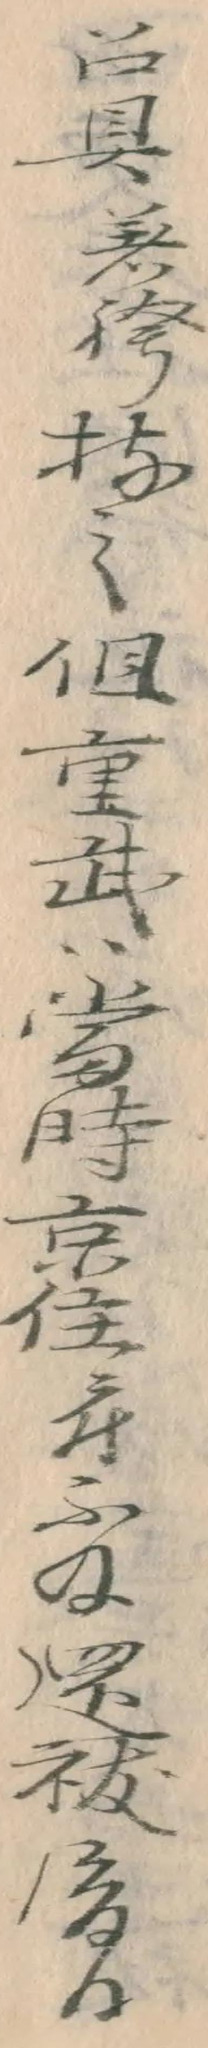召具着袴持之但重武は當時京住ニ付不及還祓後日
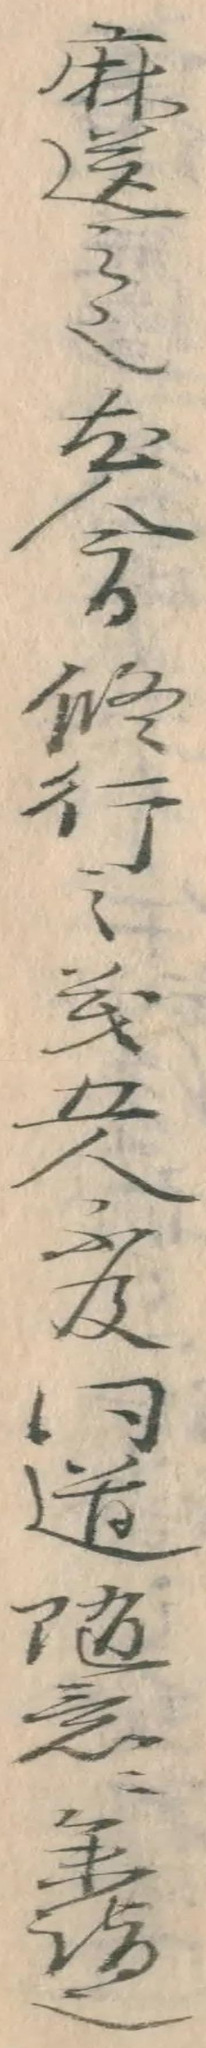麻送之也尤今日修行之義五人不及同道随意ニ参詣也
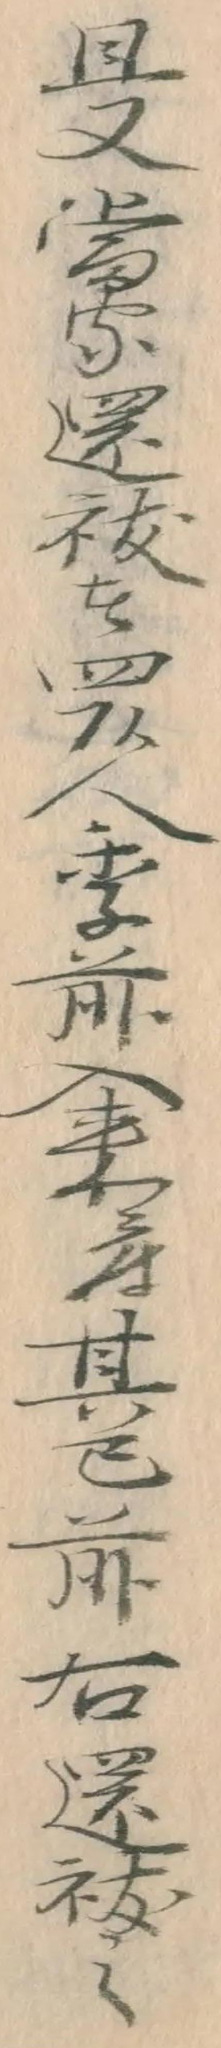且又當家還祓は四頭人季前入来ニ付其已前右還祓之

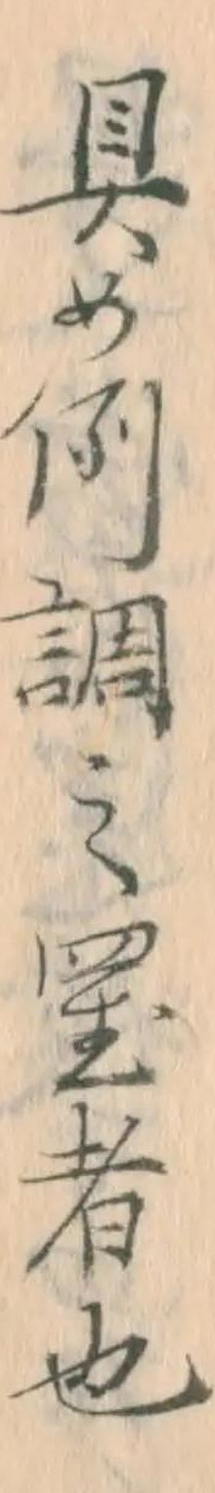具如例調之置者也
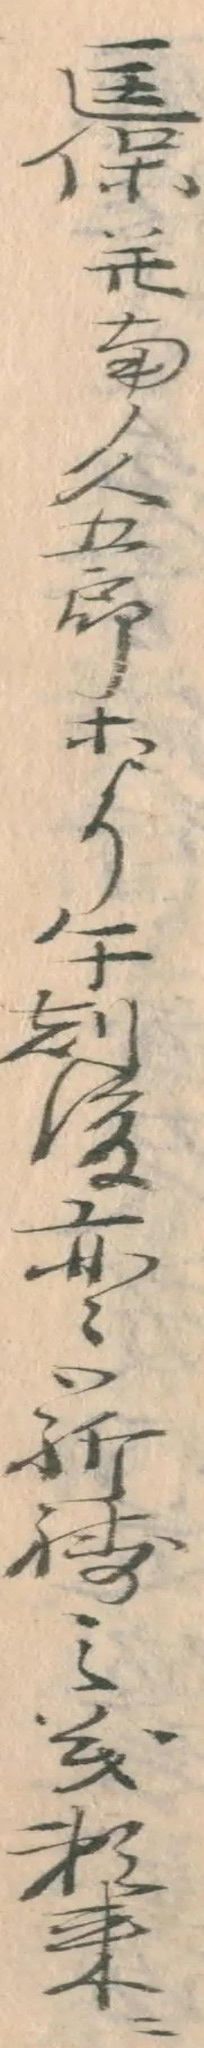一匡保并南ノ久五郎等より午刻後亦々御祈祷之義頼来ニ
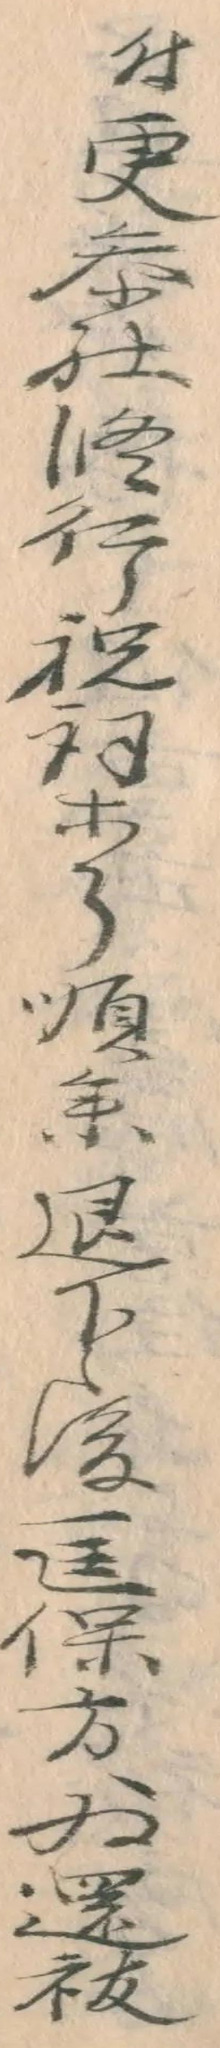付更参社修行祝詞等了順参退下候後匡保方へ為還祓
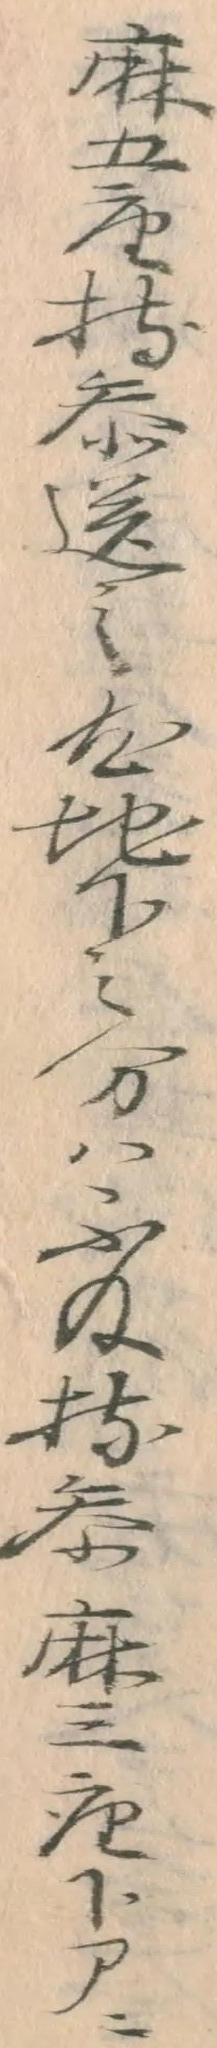麻五座持参送之尤地下之分は不及持参麻三座下部に
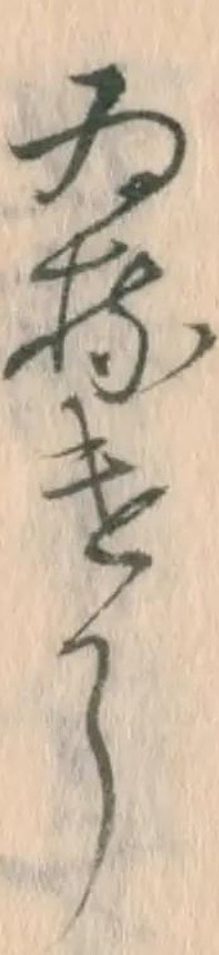為持遣了
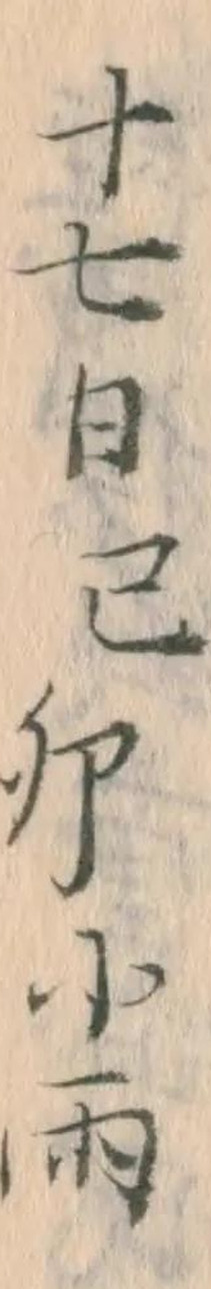十七日己卯小雨
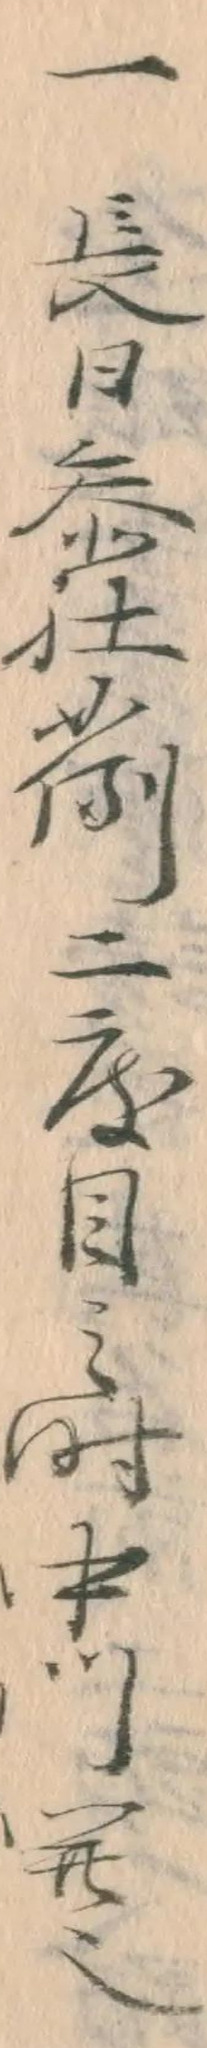一長日参社如例二度目之時中門開也
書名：賀茂社記録. 第73冊
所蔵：国立国会図書館 National Diet Library, JAPAN
